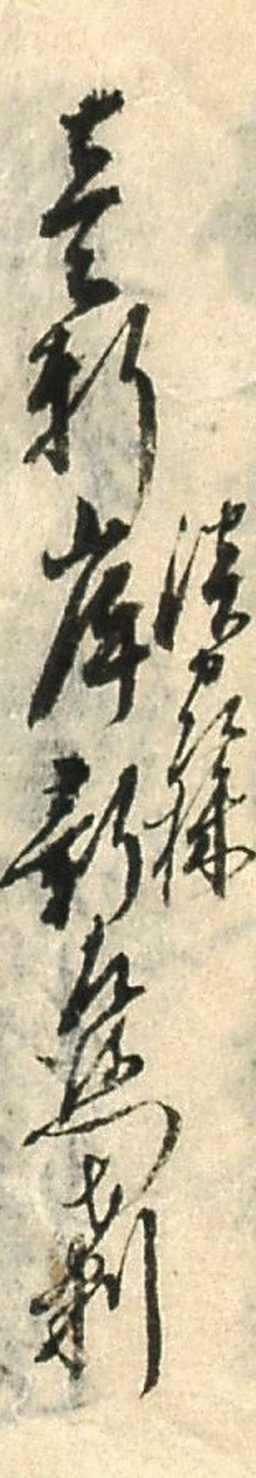壱軒岸新左衛門才判
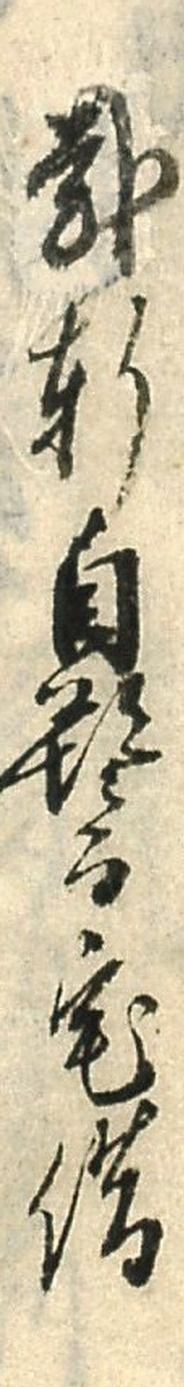弐軒自郡に而宅借
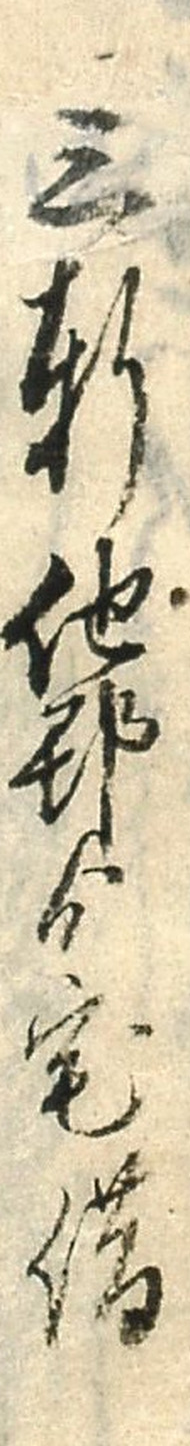三軒他郡ゟ宅借
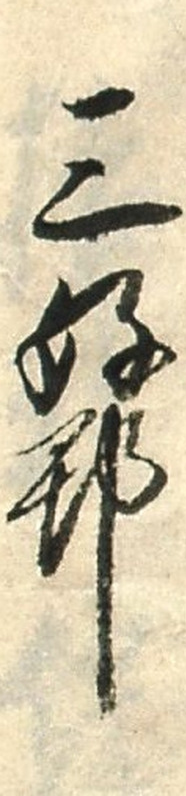三好郡
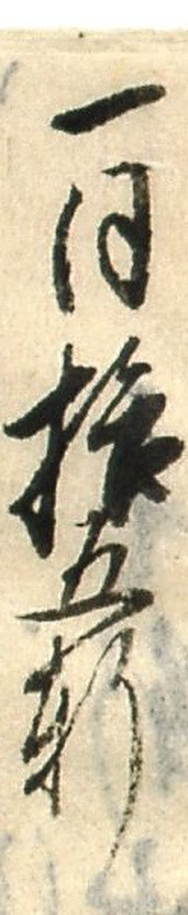一同拾五軒
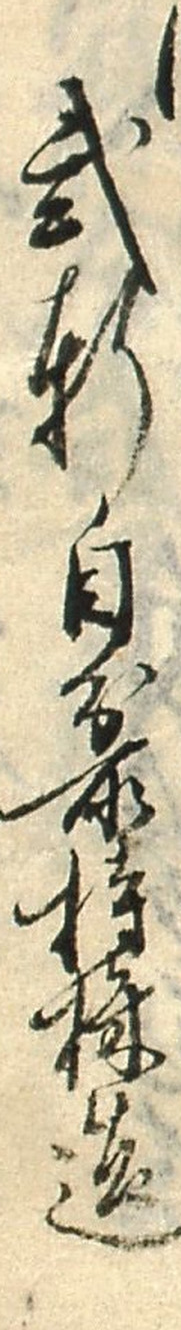弐軒自分所持株造
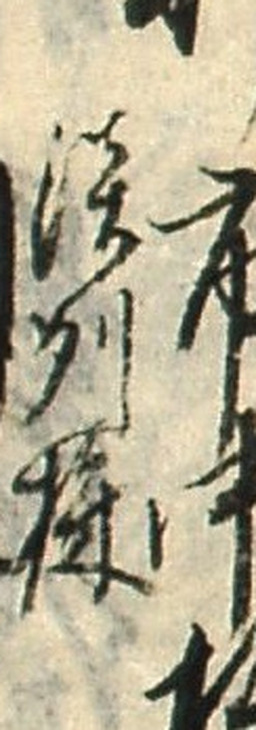淡州株
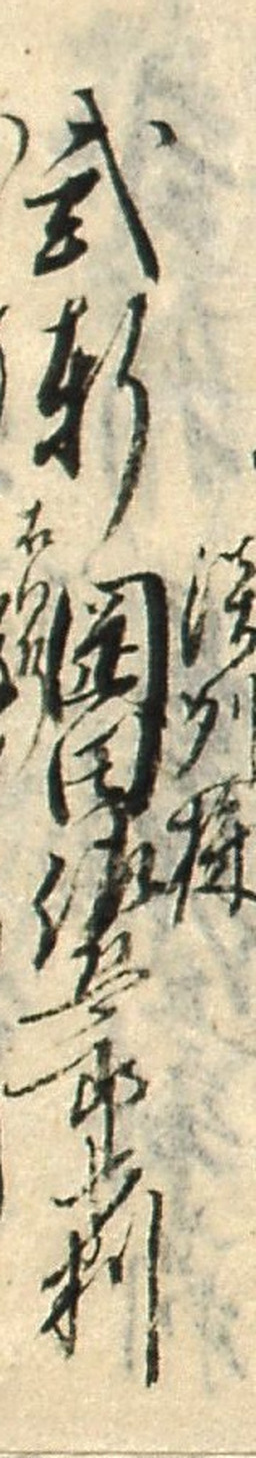弐軒岡田佐五郎才判
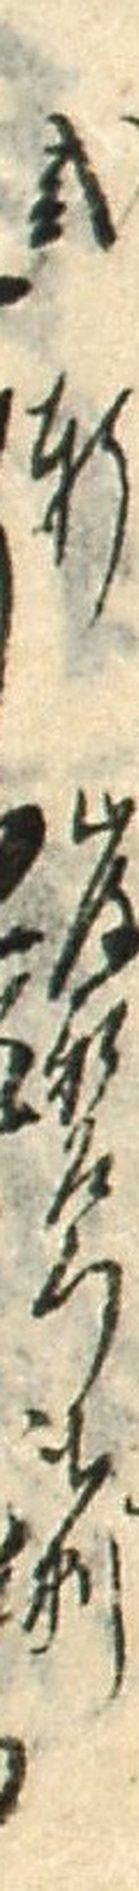弐軒岸新左衛門才判
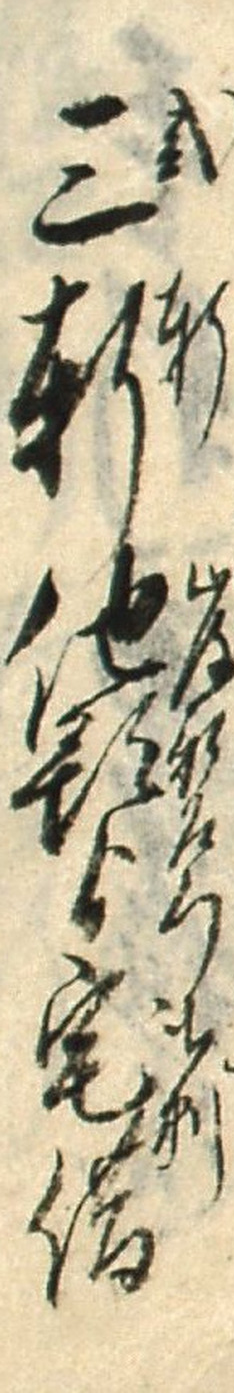三軒他郡ゟ宅借
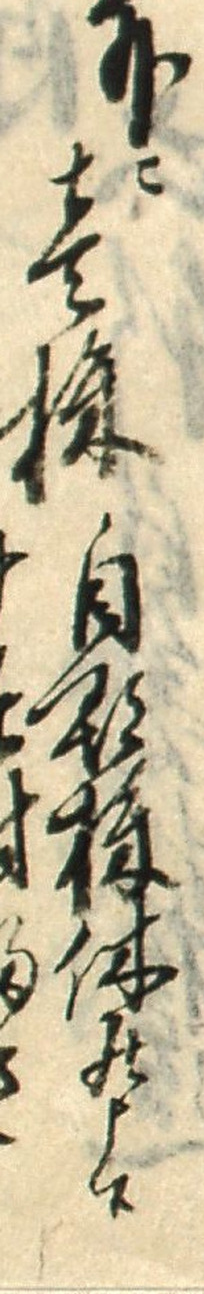壱株自郡株休居申候
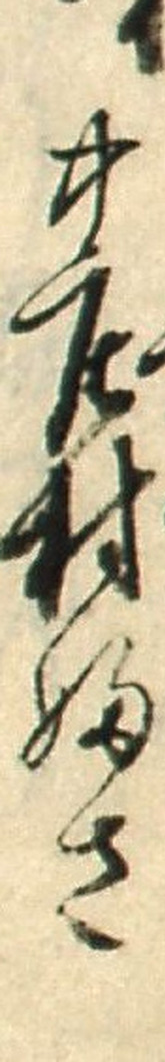中庄村ふさ

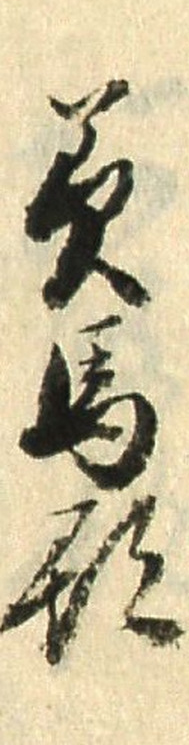美馬郡
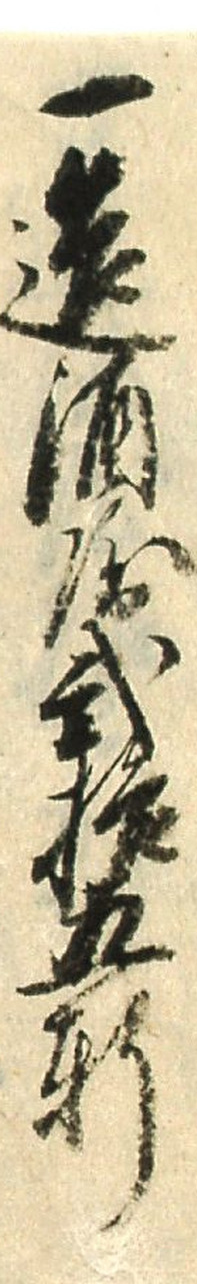一造酒屋弐拾五軒
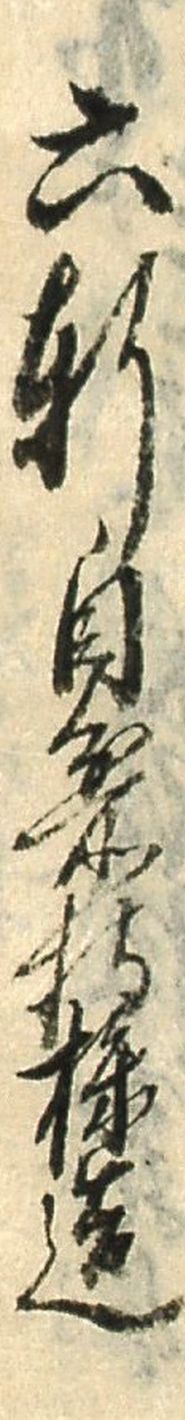六軒自分所持株造
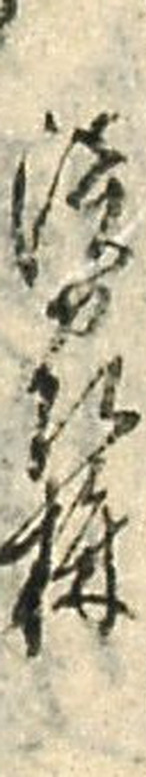淡州株
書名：南北拾郡造酒屋数並株数調子帳
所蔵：鳴門教育大学 Naruto University of Education
